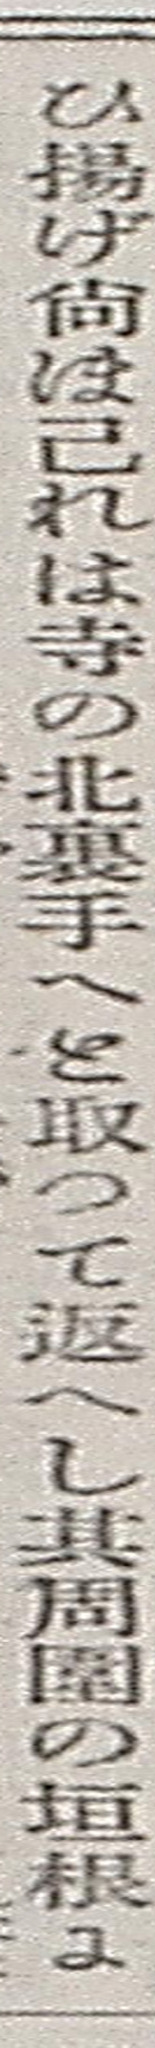ひ揚げ尚ほ己れは寺の北裏手へと取つて返へし其周囲の垣根に
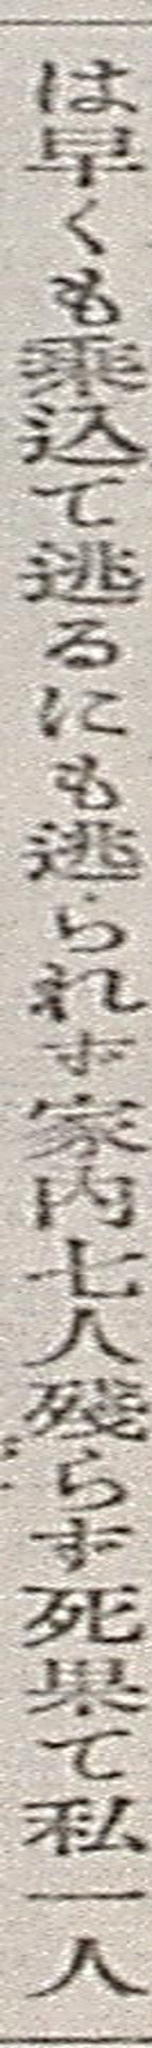は早くも乗込で逃るにも逃られず家内七人残らず死果て私一人
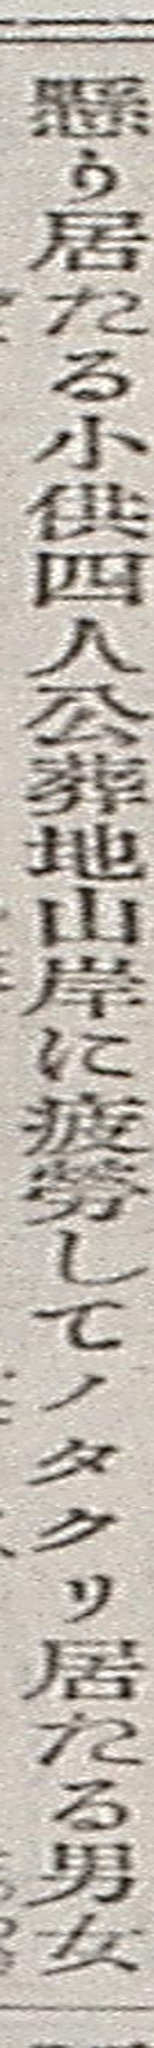懸り居たる小供四人公葬地山岸に疲労してノタクリ居たる男女
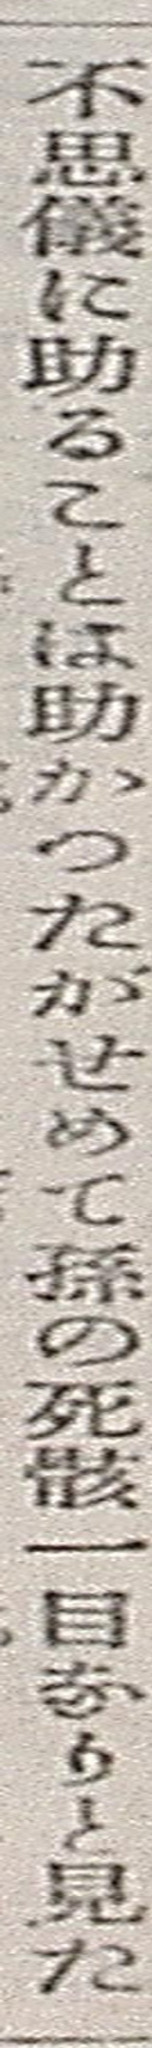不思儀に助ることは助かつたがせめて孫の死骸一目なりと見た
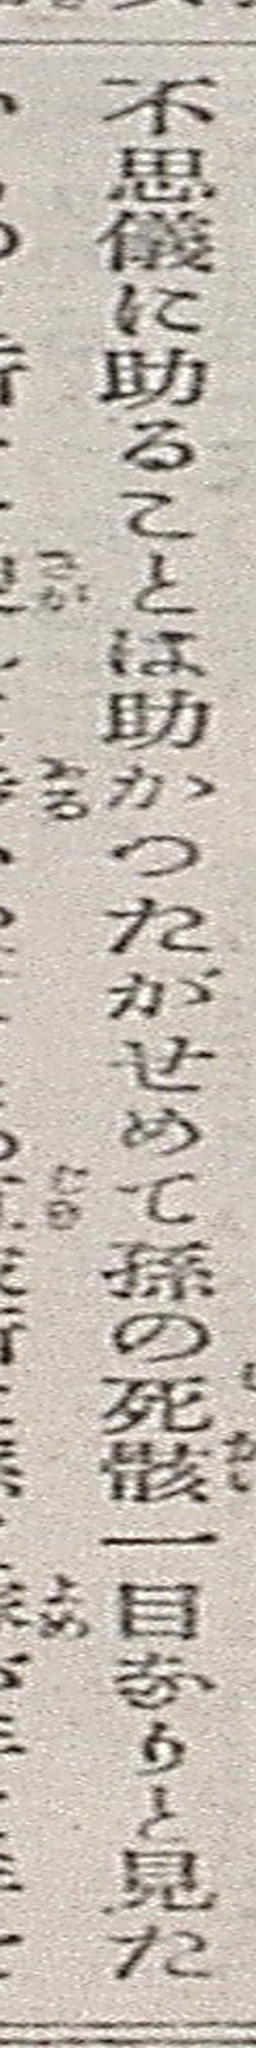不思儀に助ることは助かつたがせめて孫の死骸一目なりと見た
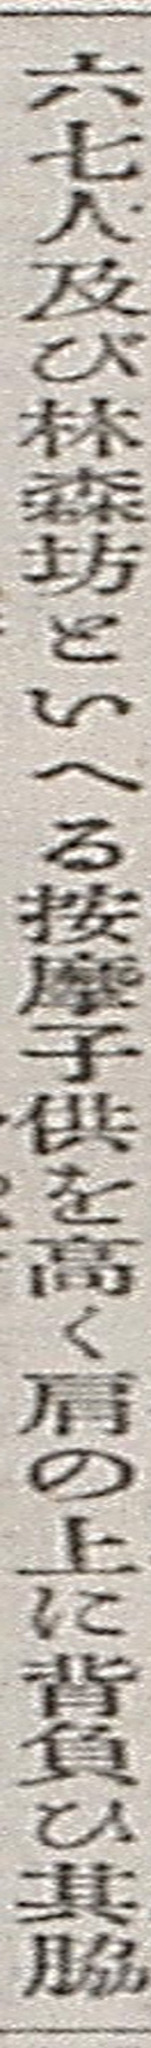六七人及び林森坊といへる按摩子供を高く肩の上に背負ひ其脇
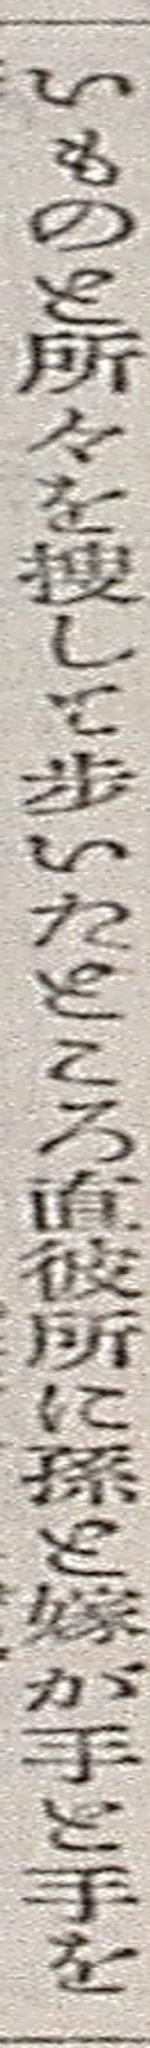いものと所々を捜して歩いたところ直彼所に孫と嫁が手と手を
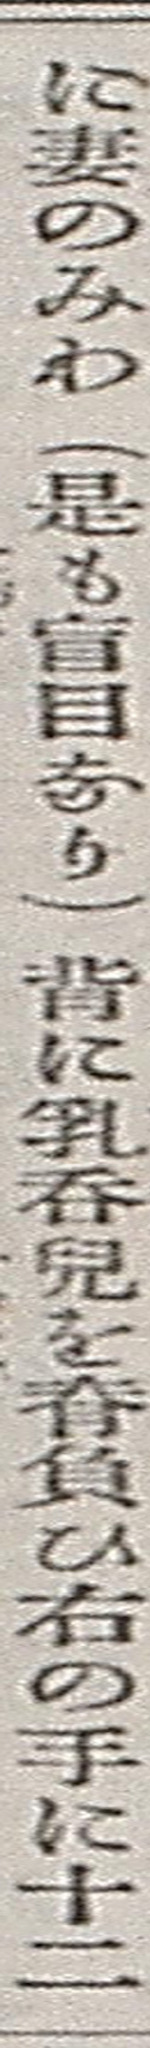に妻のみわなり）背に乳呑兒を脊負ひ右の手に十二
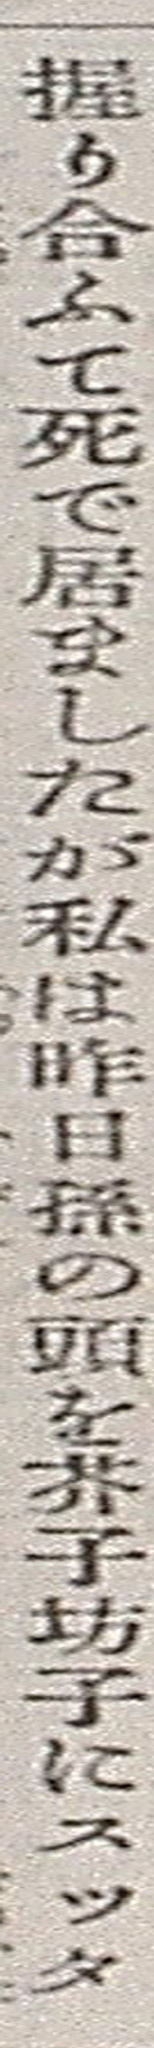握り合ふて死で居ましたが私は昨日孫の頭を芥子坊主にスッタ
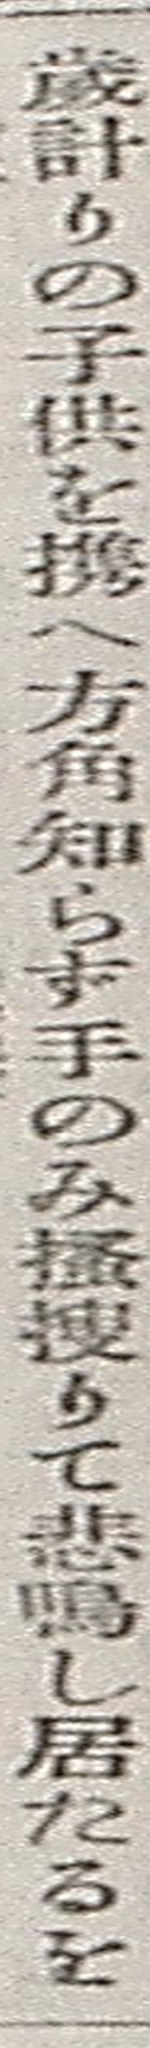歳計りの子供を携へ方角知らず手のみ掻捜りて悲鳴し居たるを
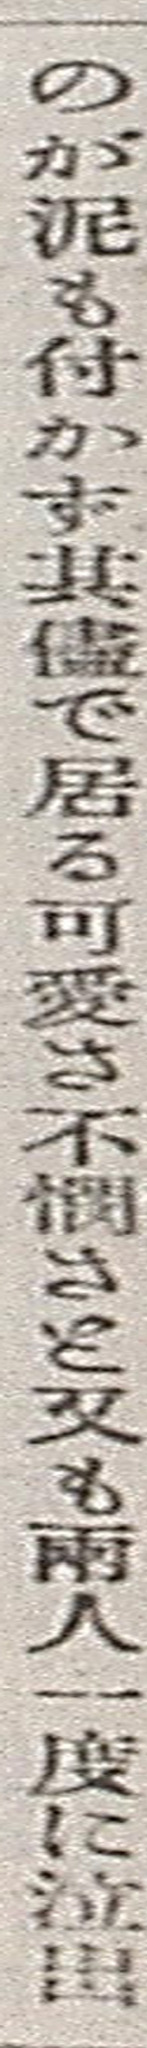のが泥も付かず其侭で居る可愛さ不憫さと又も両人一度に泣出
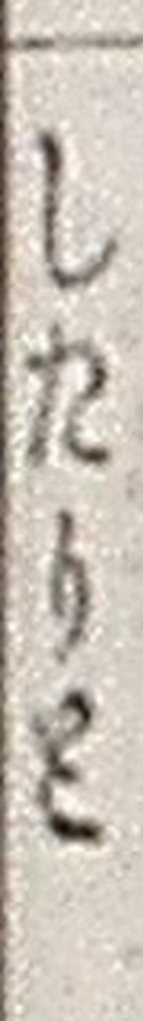したりと
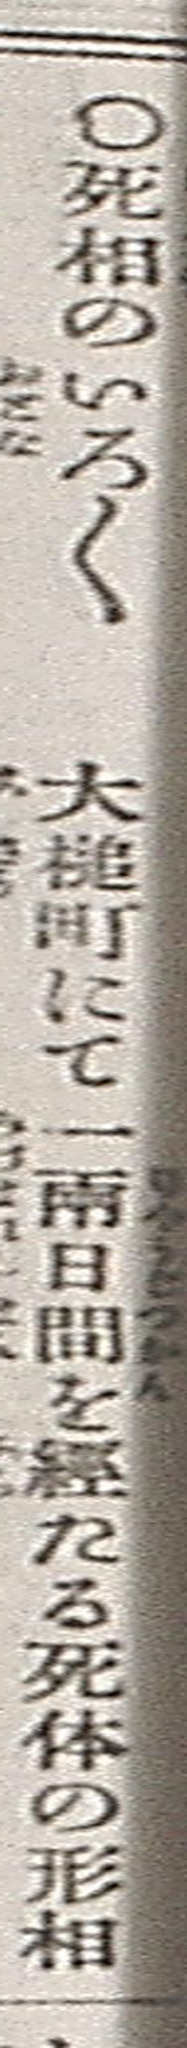○死相のいろ〳〵大槌町にて一両日間を経たる死体の形相
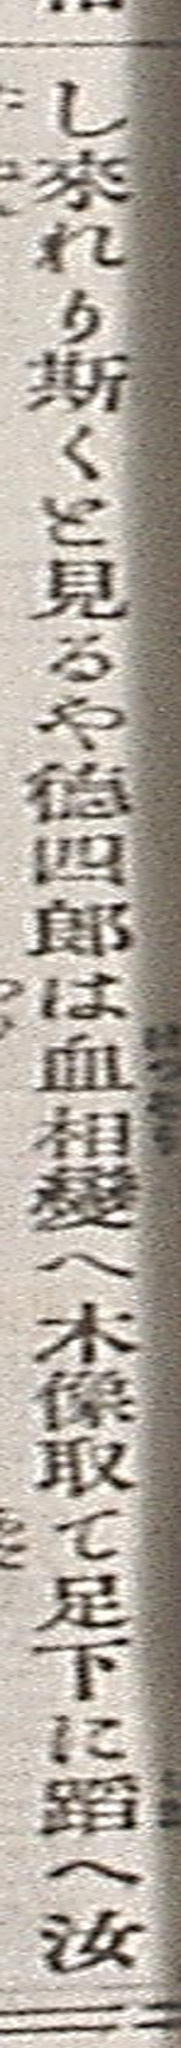し来れり斯くと見るや徳四郎は血相変へ木像取て足下に蹈へ汝
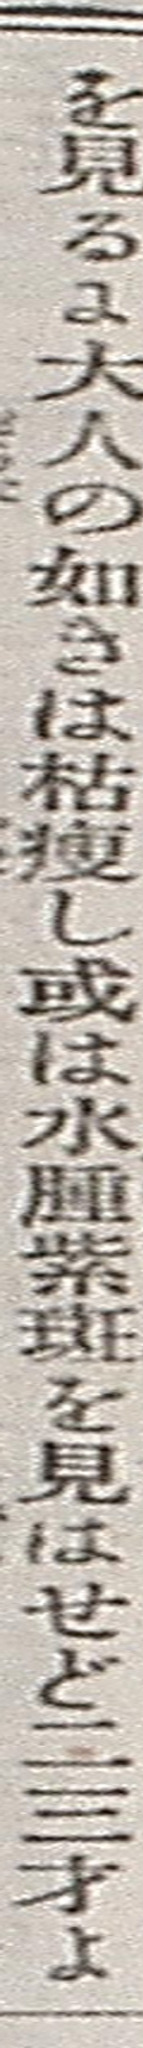を見るに大人の如きは枯痩し或は水腫紫斑を見はせど二三才よ
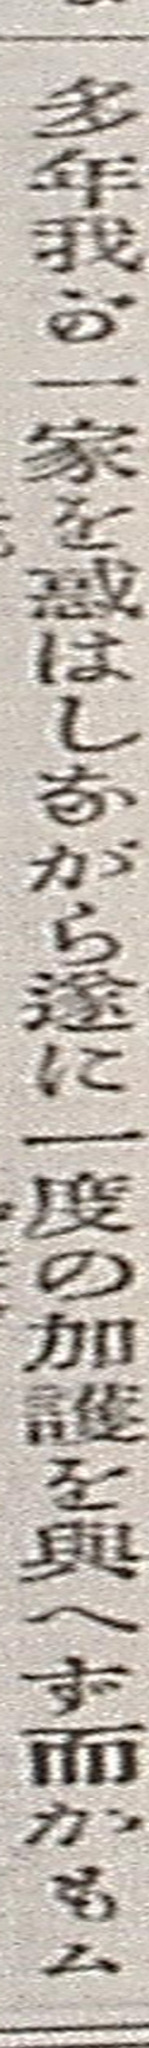多年我が一家を惑はしながら遂に一度の加護を与へず而かもム
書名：風俗畫報臨時増刊第百二十號　大海嘯被害録（下）
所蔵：東京大学地震研究所図書室 Earthquake Research Institute Library, The University of Tokyo, JAPAN
